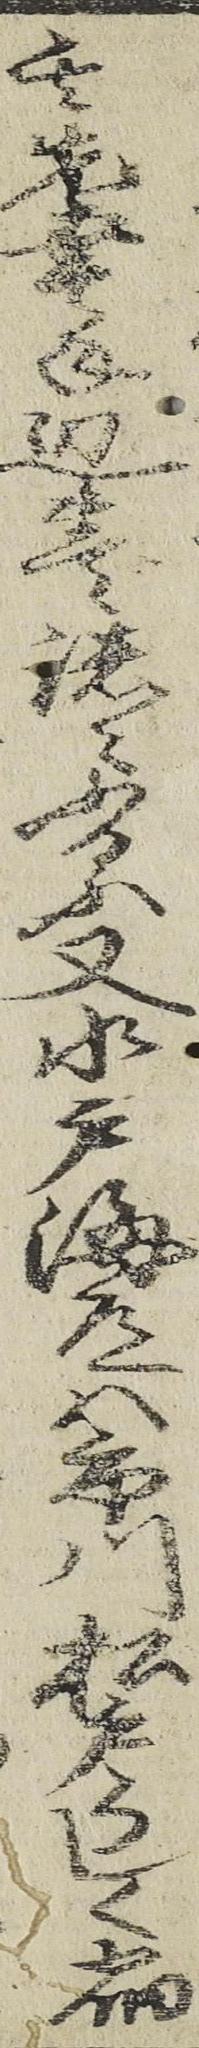其先幸手辺まで諸々ふるふ又水戸海道は市川松戸うしく宿
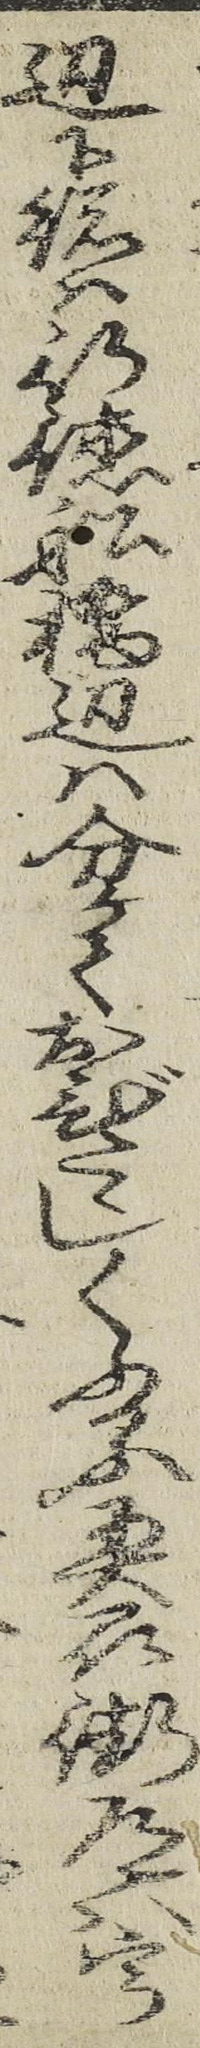辺下総は行徳船橋辺は分ヶておびたゝしくふるふ奥州街道は宇
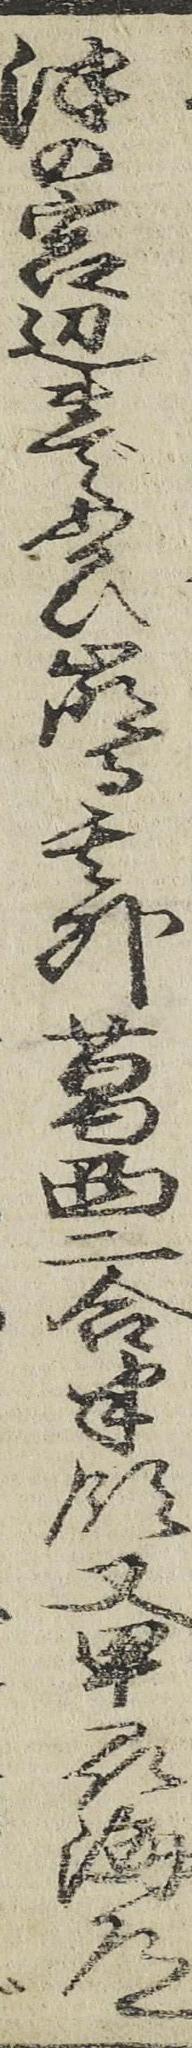津の宮辺までふるひ崩る其外葛西二合半領又甲州街道
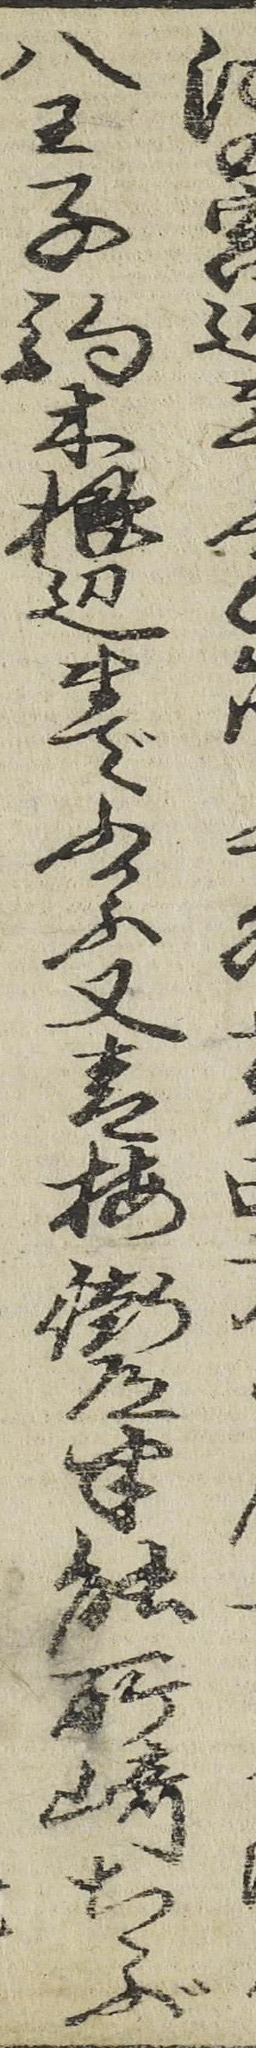八王子駒木根辺までふるふ又青梅海道半能所崎ちゝぶ
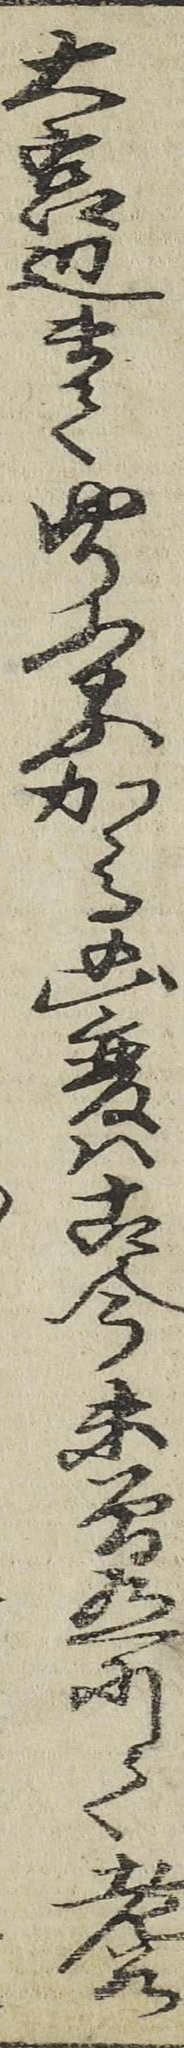大宮辺まてゆりふるにかゝる凶変は古今未曾有にて老若
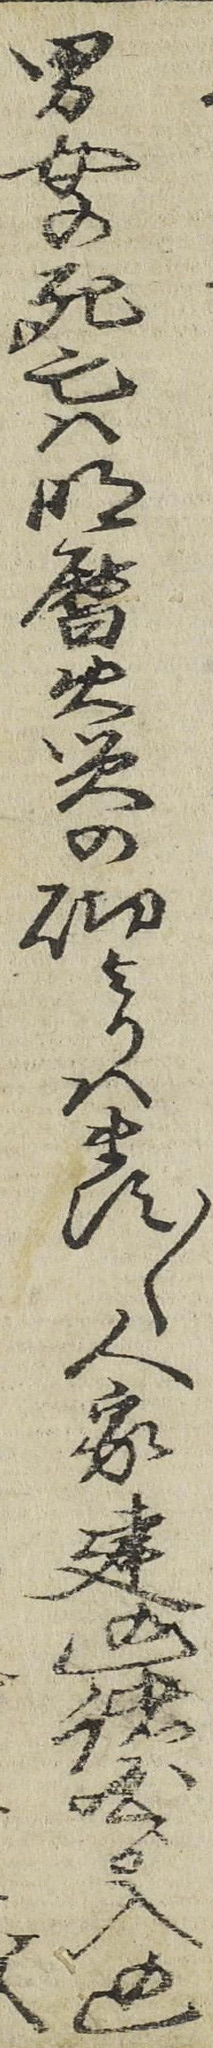男女の死亡は明暦火災の砌よりはます〳〵人家建諸国込ゟ入込
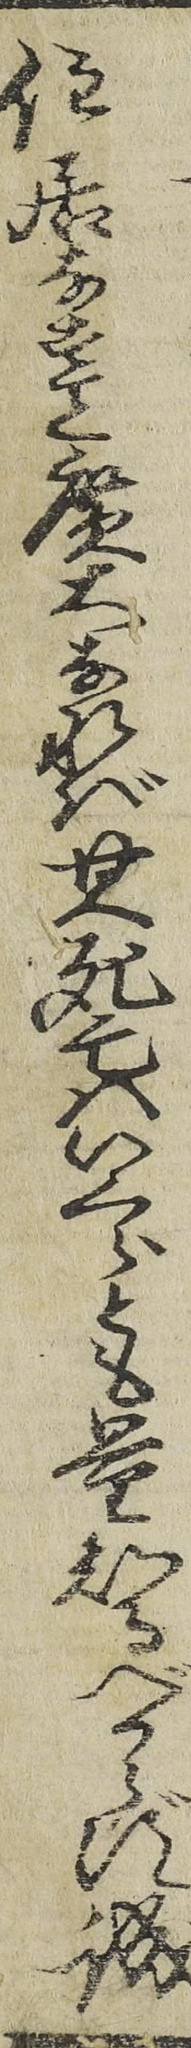住居なすこと広大ならば其死亡はいくらとも量知るべからず誠

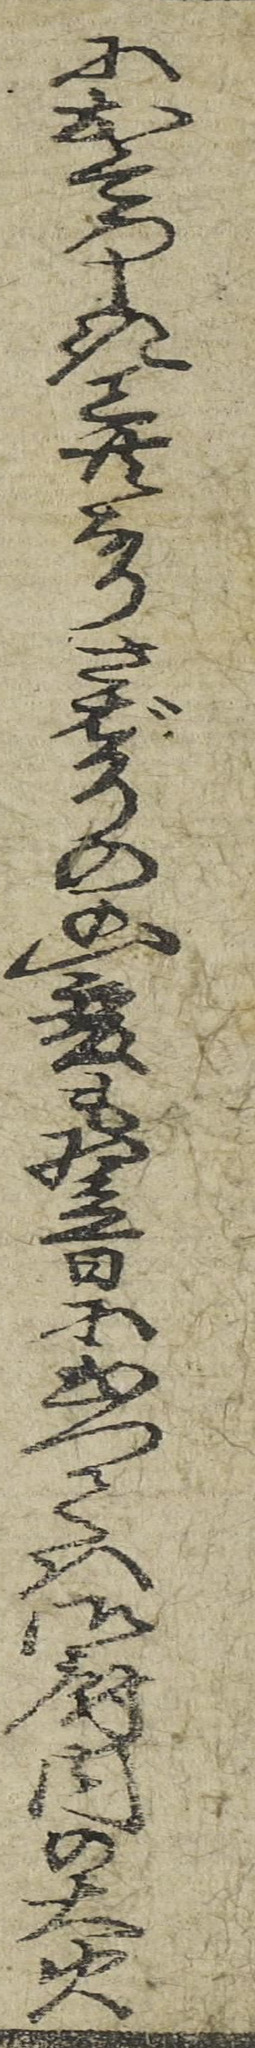におそろしきこと共なりさばかりの凶変も翌日に至つては御府内の大火
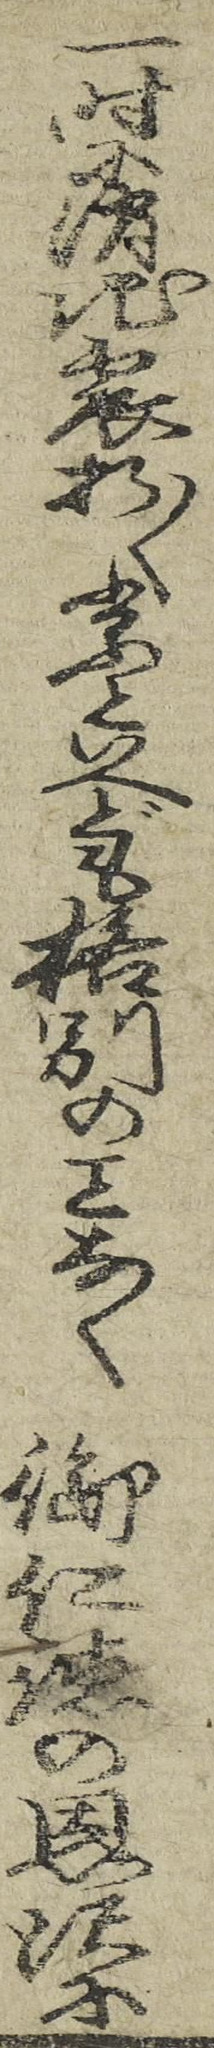一時に消地震折々ふるふといへとも格別のことなく御仁徳之恩沢に
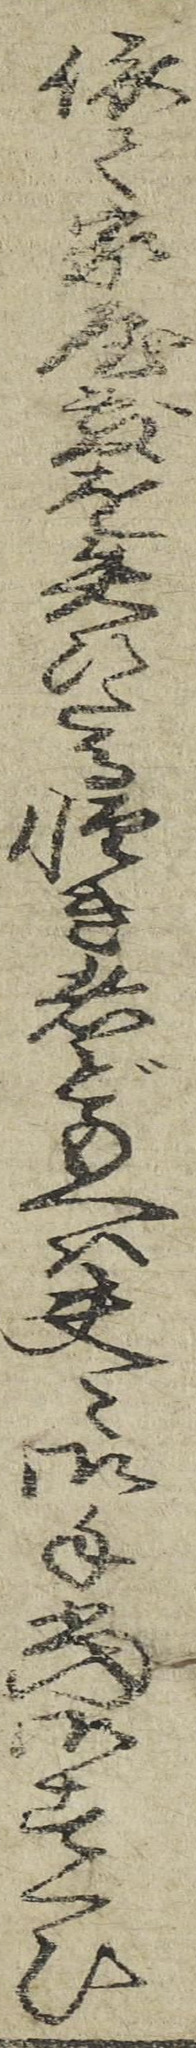依て家屋敷を失ふたる軽き者どもへは夫々御手当御すくひ
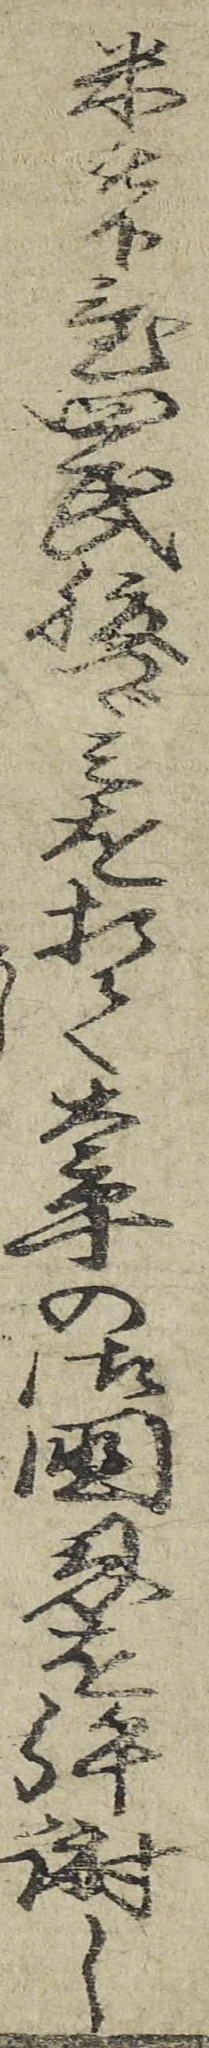米被下置四民腹つゞみを打て大平の御国恩を拝澍し
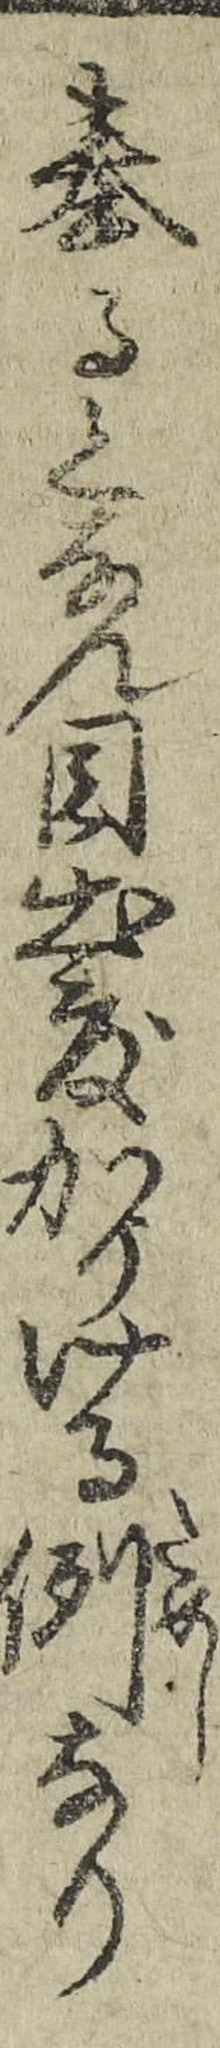奉るとなん目出度かりける例なり
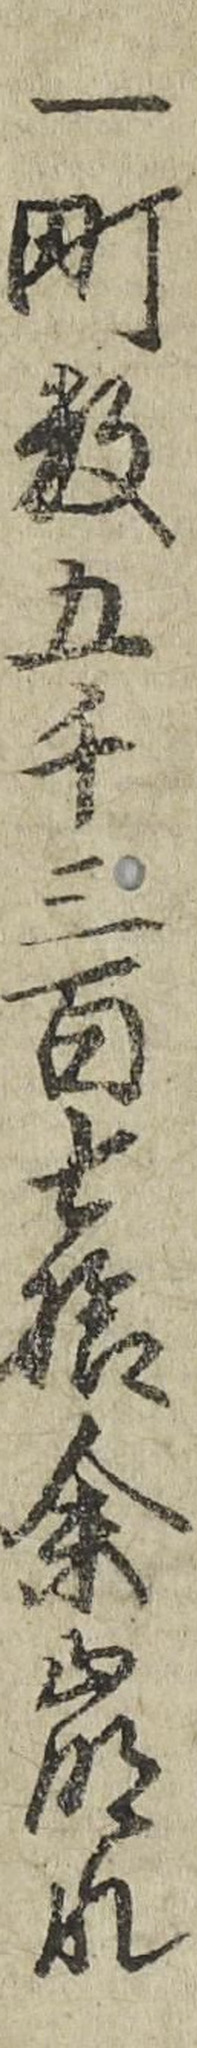一町数五千三百七拾余崩れ
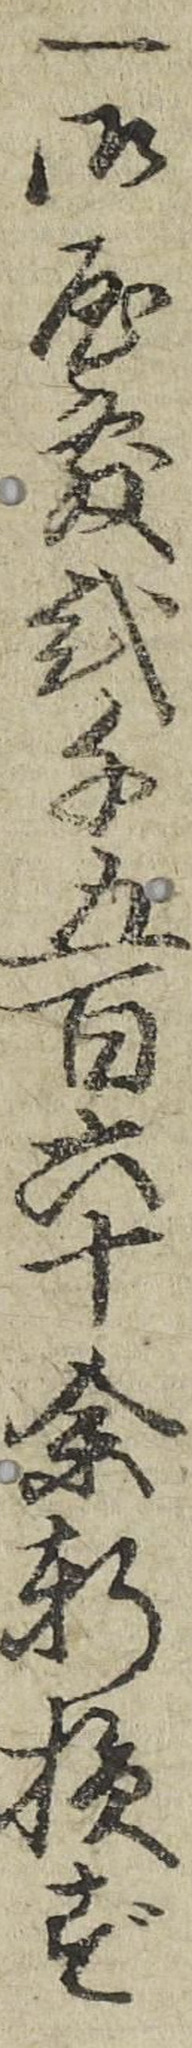一御屋敷弐千五百六十余軒損ず
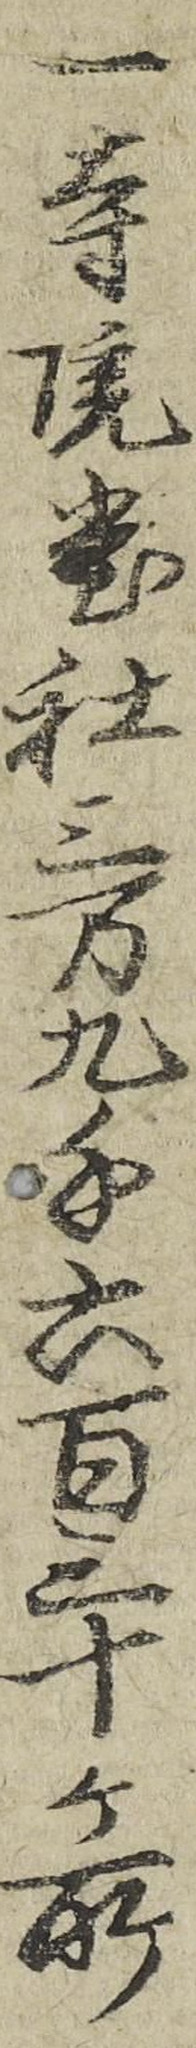一寺院堂社三万九千六百三十ヶ所
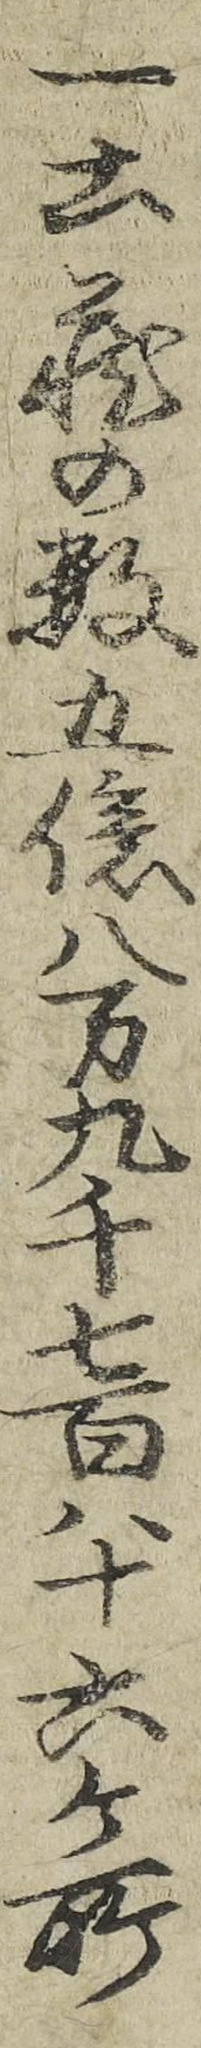一土蔵の数五億八万九千七百八十六ヶ所
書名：安政大地震畧記　全
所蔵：東京大学地震研究所図書室 Earthquake Research Institute Library, The University of Tokyo, JAPAN
